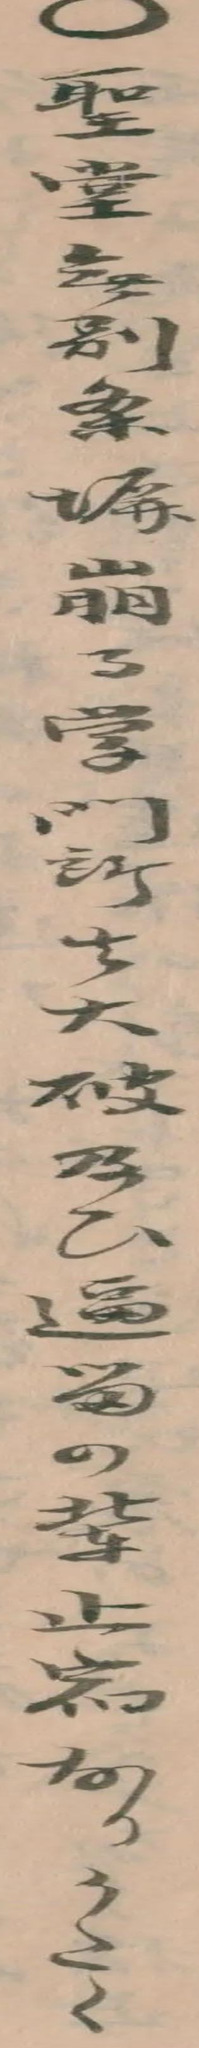〇聖堂無別条塀崩る学門所は大破及ひ逼留の輩止宿なりかたく
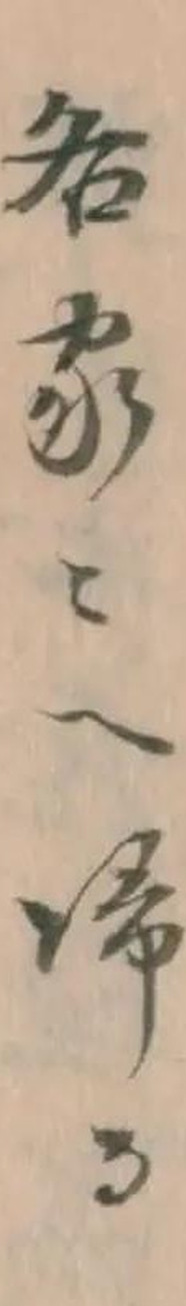各家々へ帰る
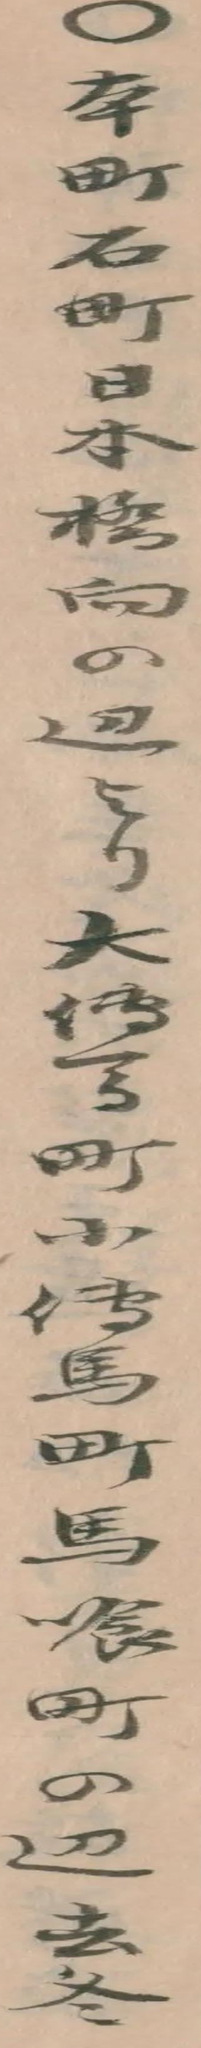〇本町石町日本橋向の辺より大伝馬町小伝馬町馬喰町の辺去冬
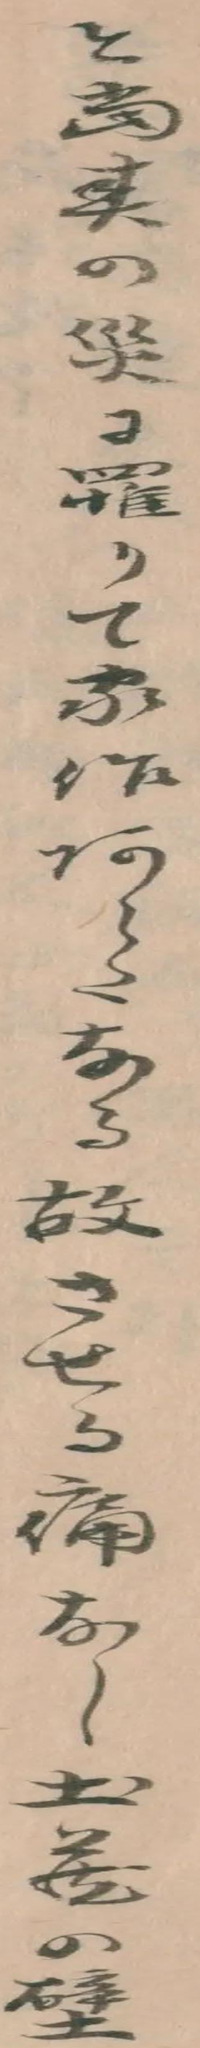と当春の災に罹りて家作あらたなる故させる痛なし土蔵の壁
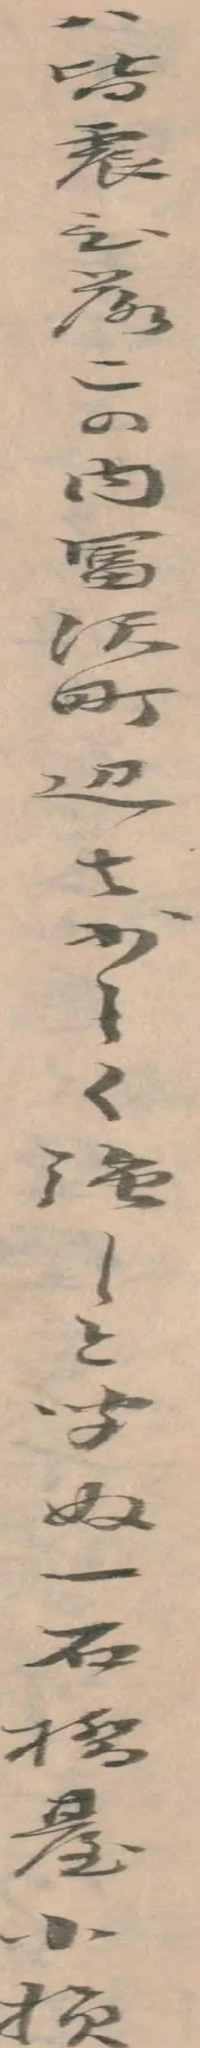は皆震ひ落この内富沢町辺は少しく強しと聞ぬ一石橋台小損
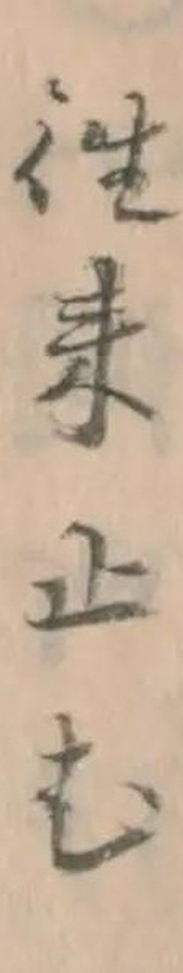往来止む

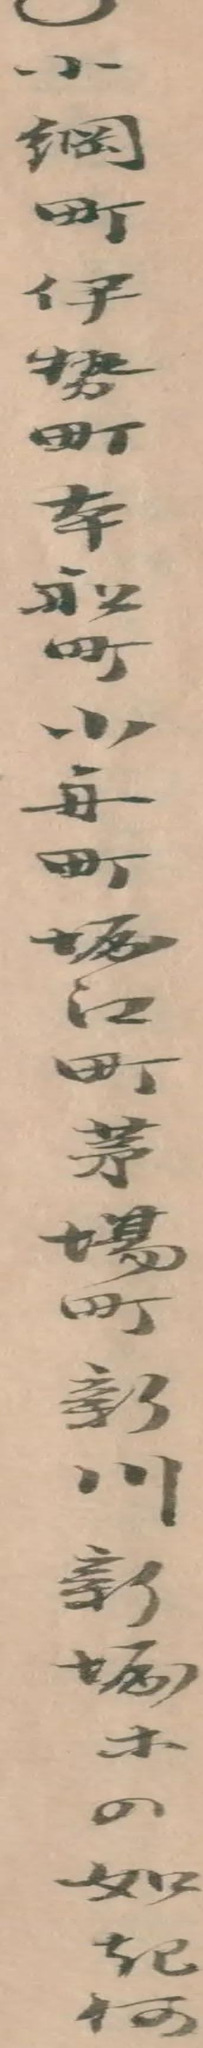小網町伊勢町本船町小舟町堀江町茅場町新川新堀等の如き河
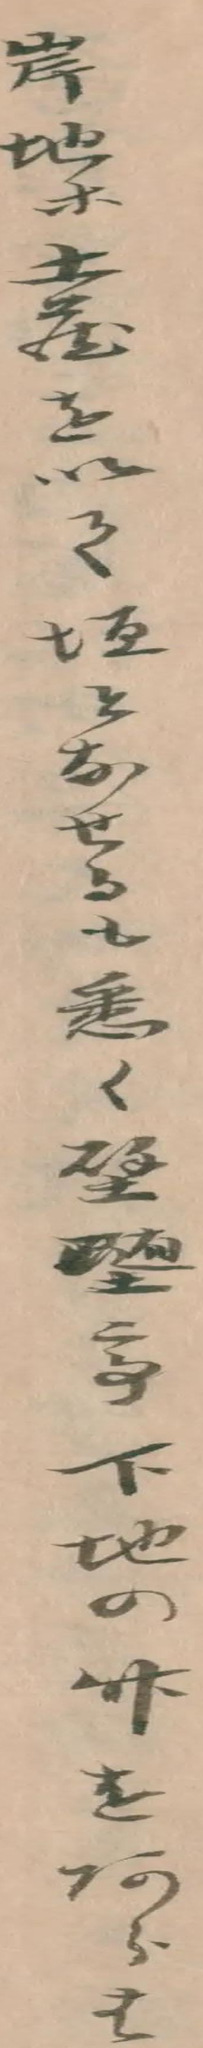岸地等土蔵を以て垣となせるも悉く壁堕て下地の竹をあらは
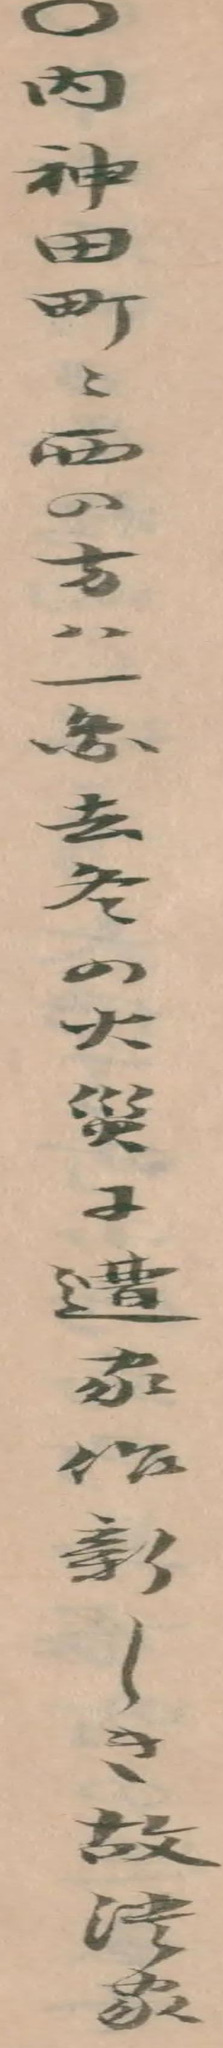〇内神田町々西の方は一円去冬の火災に遭家作新しき故潰家
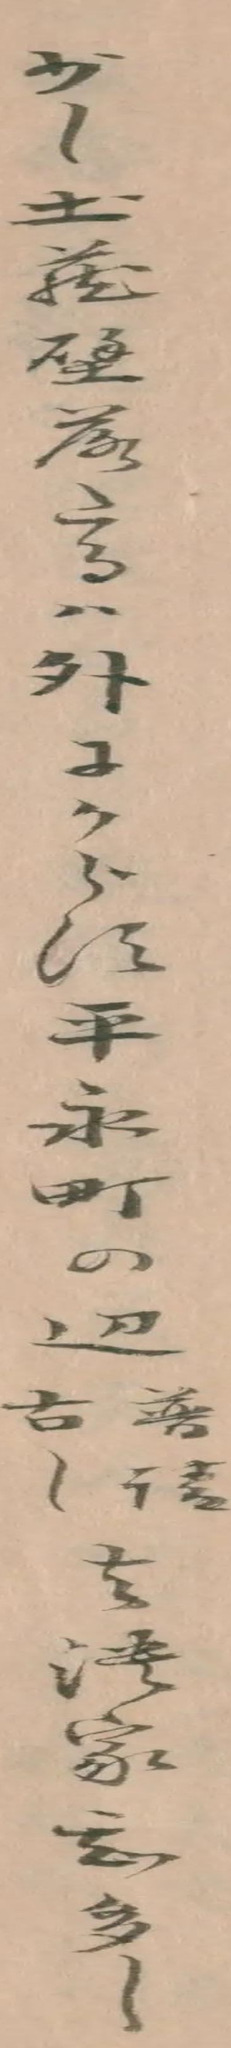少し土蔵壁落たるは外にからす平永町の辺普請古しは潰家甚多し
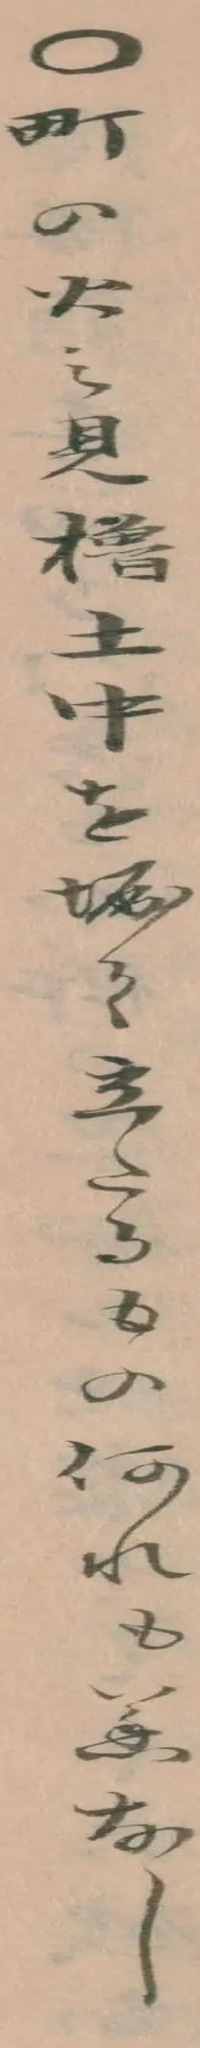〇町の火之見櫓土中を堀て立たるもの何れも恙なし
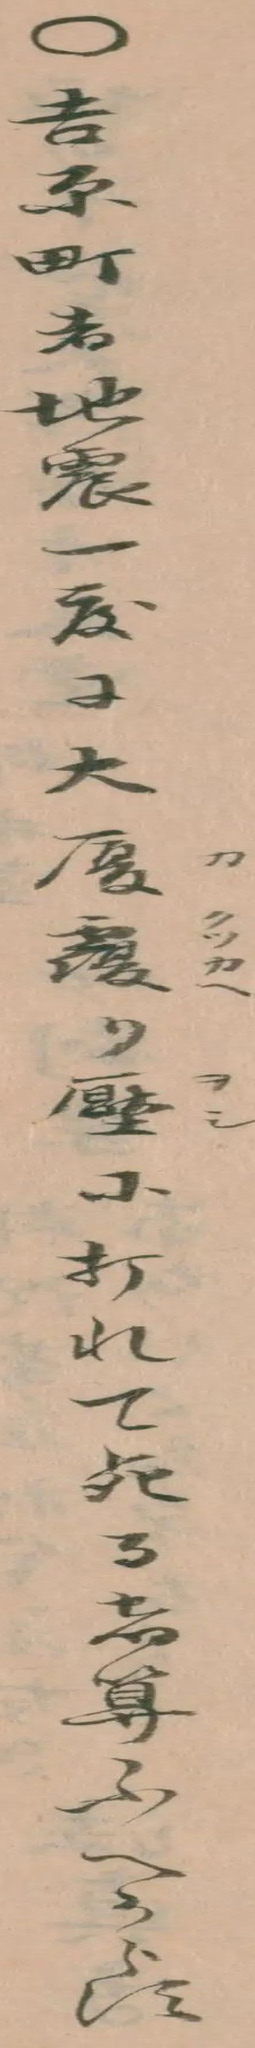〇吉原町は地震一度に大厦覆り壓に打れて死る者算ふへからす
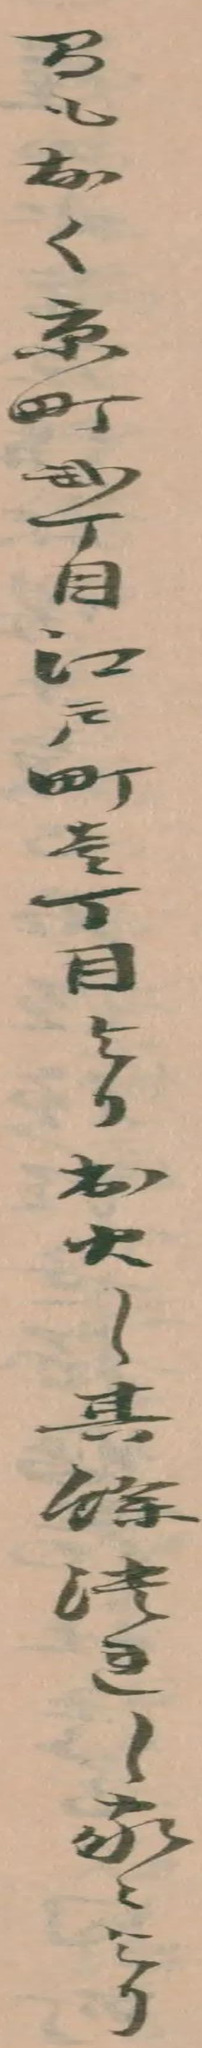間もなく京町弐丁目江戸町壱丁目より出火し其余潰れし家々より
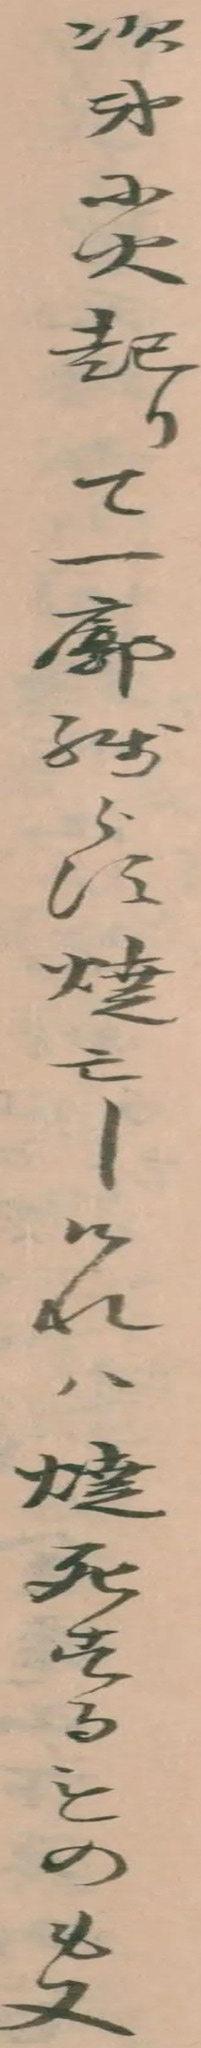次第に火起りて一廓残らす焼亡しけれは焼死するものも又
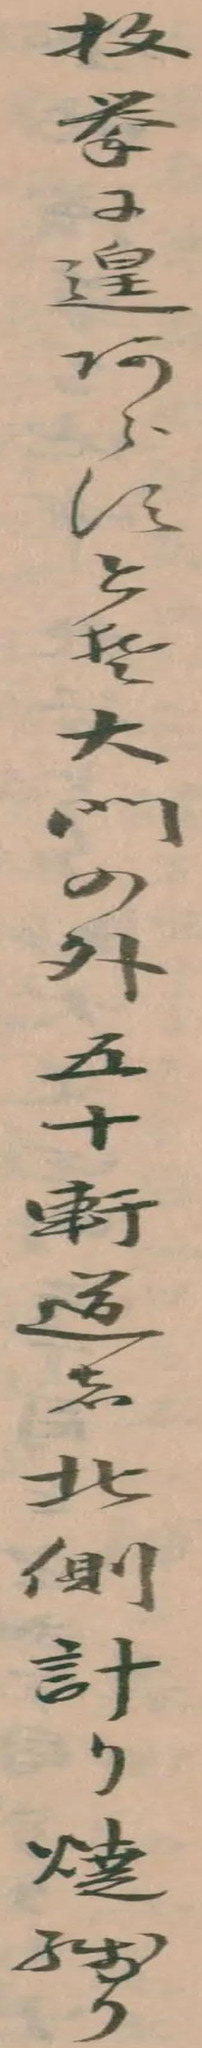枚挙に遑あらすとそ大門の外五十軒道は北側計り焼残り
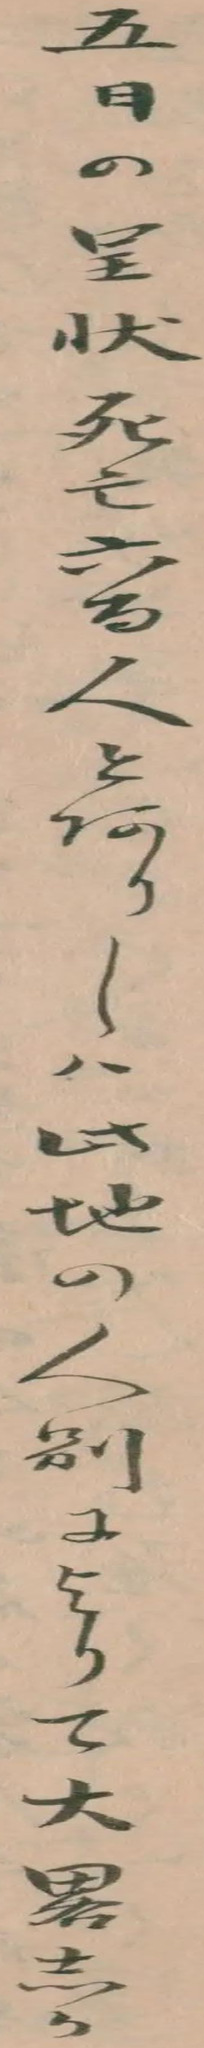五日の呈状死亡六百人とありしは此地の人別によりて大畧しか
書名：地災撮要. 巻7-9(地震之部)
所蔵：国立国会図書館 National Diet Library, JAPAN
